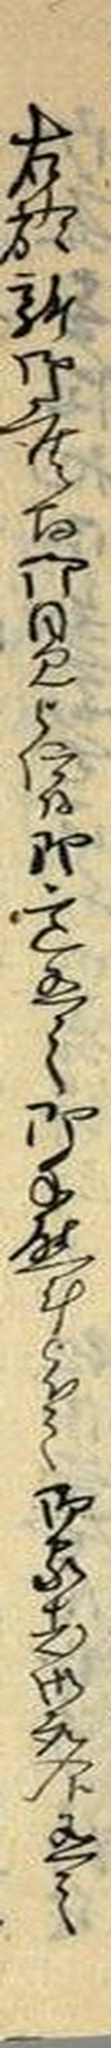右於新御座之間御目見被仰付御意有之御手熨斗被下之御家老御取合有之
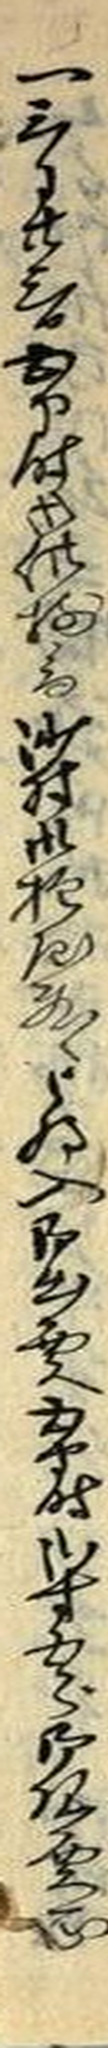一三月廿三日五半時御供揃ニ而砂村御抱屋敷へ被為入御出殿五半時弐寸五分御帰殿正
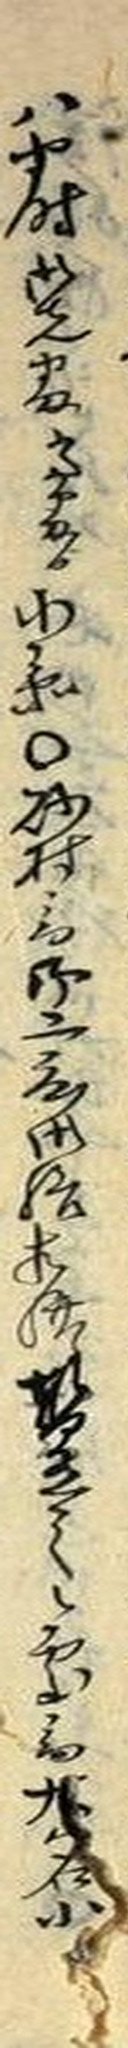八半時御先番当番ゟ小兵衛○砂村ニ而御二度御膳相済暫有之候処ニ而大名小
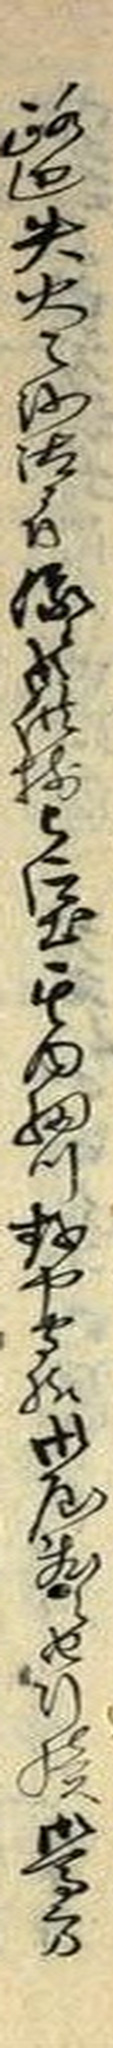路辺失火之沙汰ニ付俄ニ御供揃被仰出其内細川越中守様御屋敷之由引続御馬方
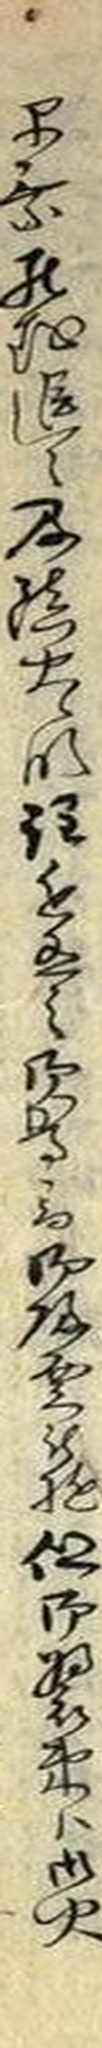早乗罷越追々及鎮火候段注進有之御駕ニ而御帰殿被遊但御装束ハ御火
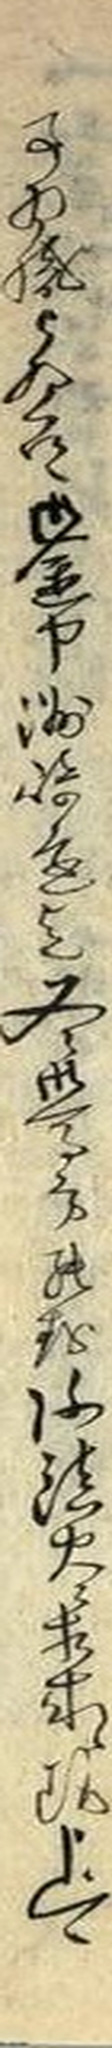事羽織被為召候御途中洲崎辺迄又々御馬方罷越弥鎮火ニ相成候趣申上候
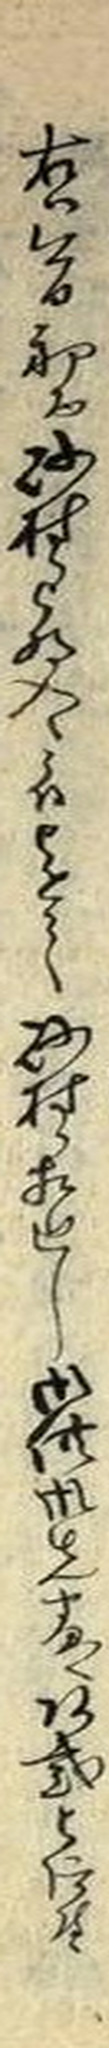右ハ今日初而砂村へ被為入候ニ付被進之砂村ヘ相廻し御供先番へ頂戴被仰付候
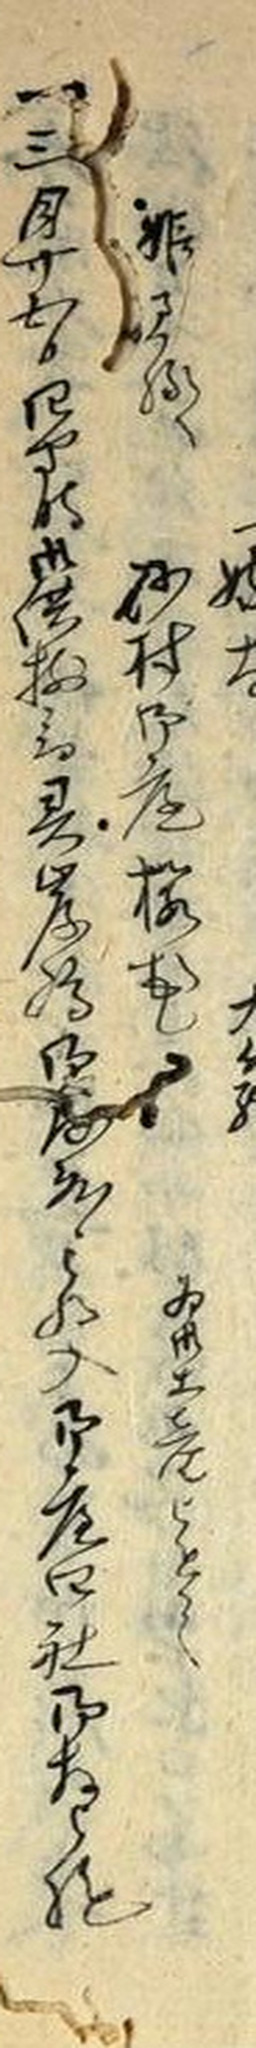一三月廿五日四半時御供揃ニ而霊岸島御屋敷へ被為入御庭四社御拝被遊

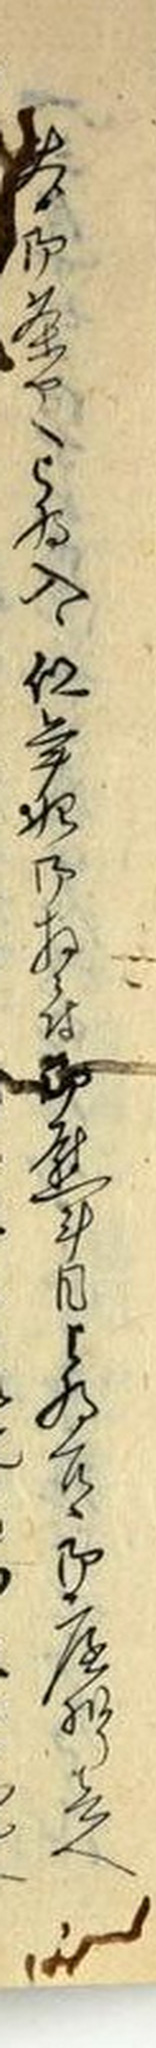夫ゟ御茶やへ被為入候但年始御拝ニ付御熨斗目被為召候御庭掛り壱人
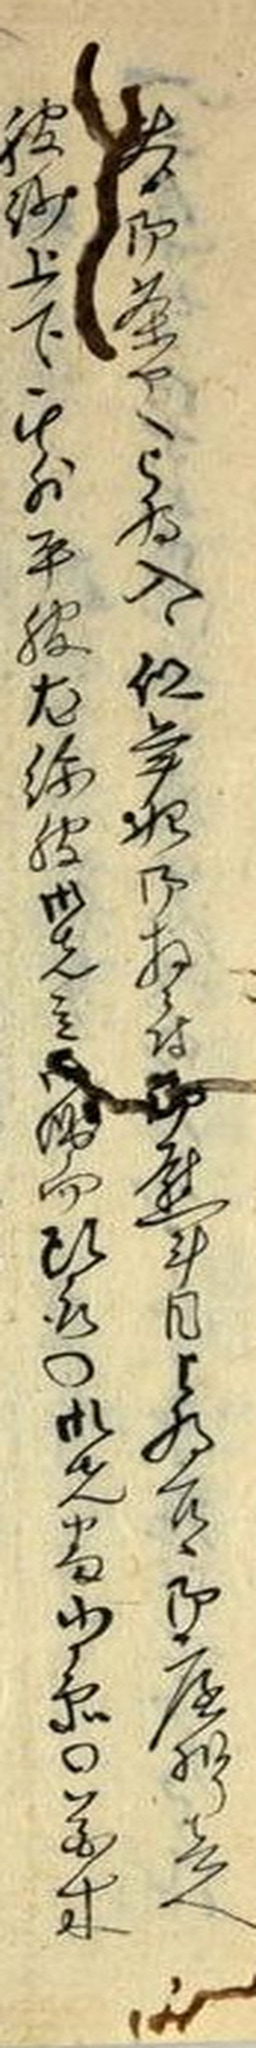服紗上下其外平服尤綿服御先立御側向頭取○御先番小兵衛○花木
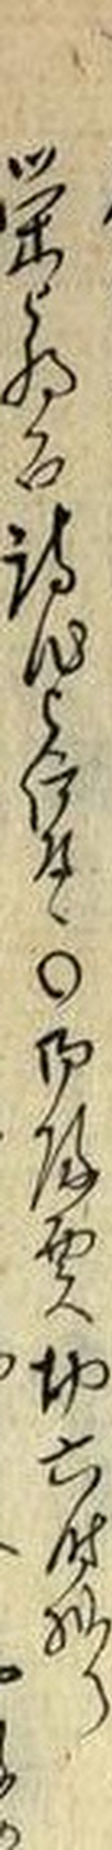栄被為召詩作被仰付候○御帰殿切六時掛り
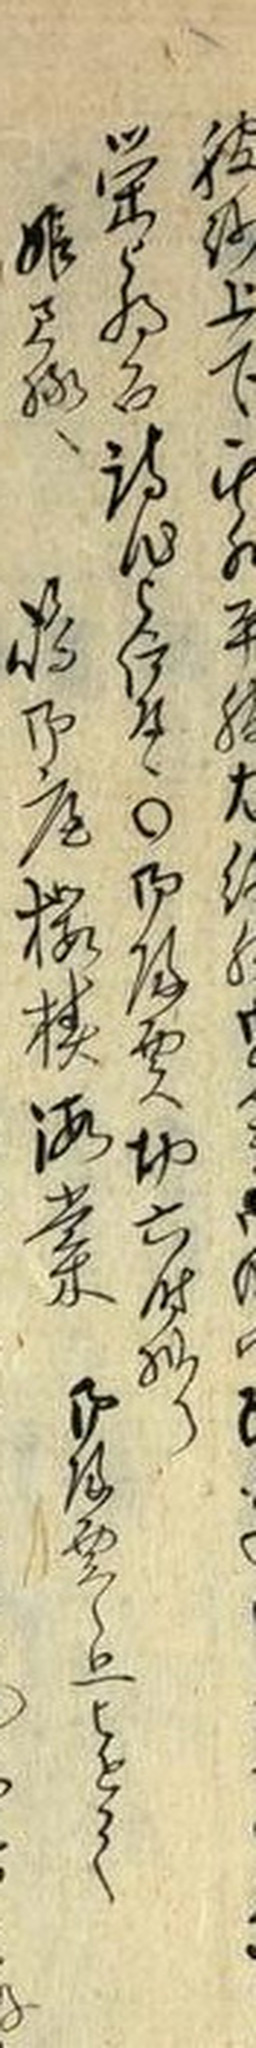姫君様へ嶋御庭桜椿海棠御帰殿之上被進之
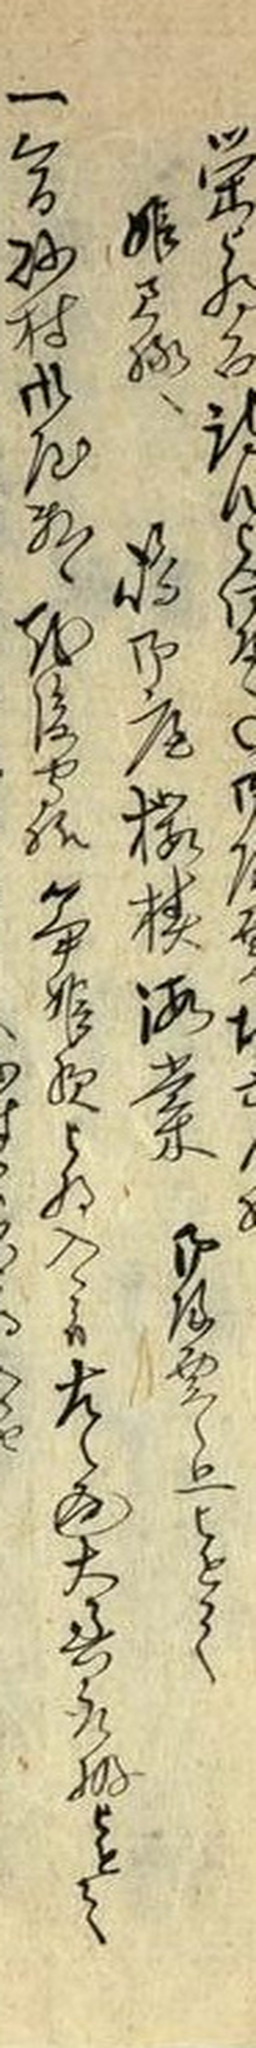一今日砂村御屋敷へ越後守様箏姫様被為入候ニ付左之通大奥取扱被進之
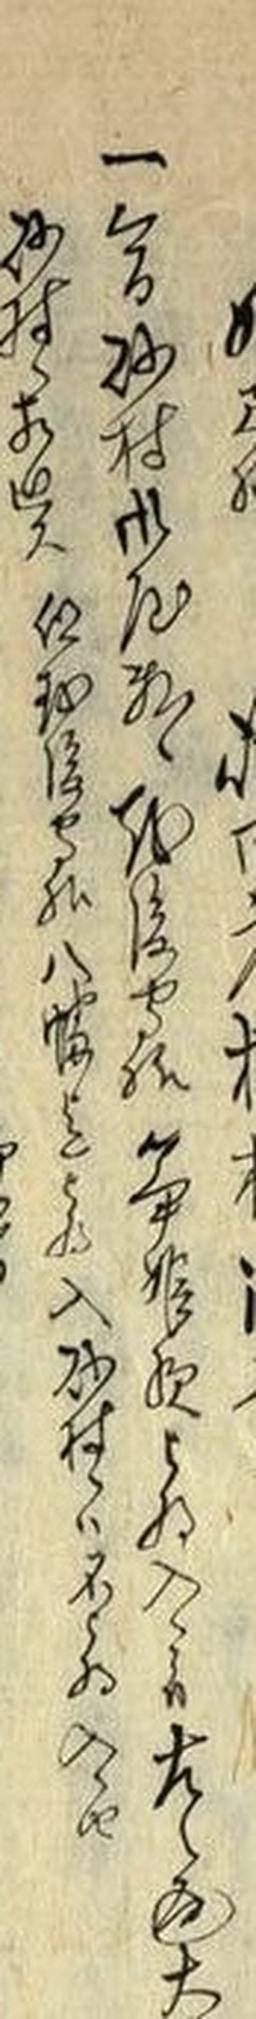砂村へ相廻ス但越後守様八幡迄被為入砂村へハ不被為入候由
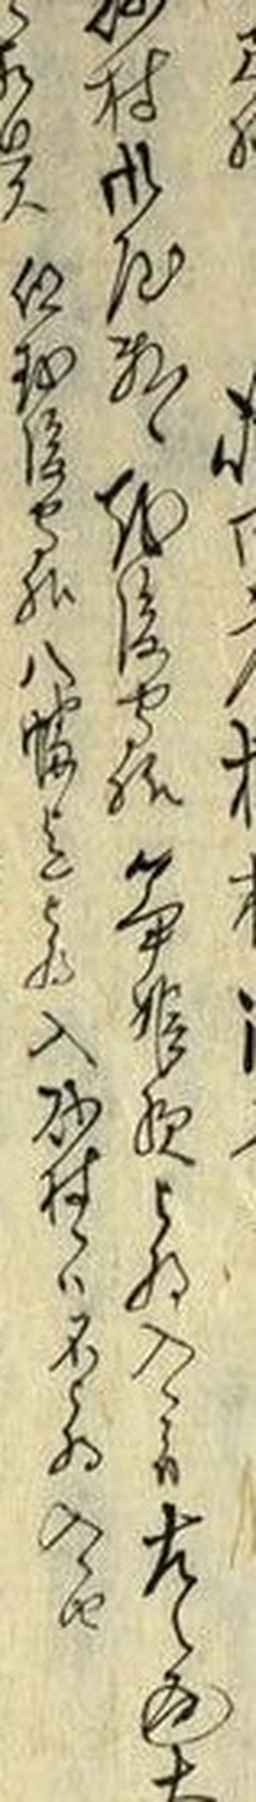砂村へ相廻ス但越後守様八幡迄被為入砂村へハ不被為入候由
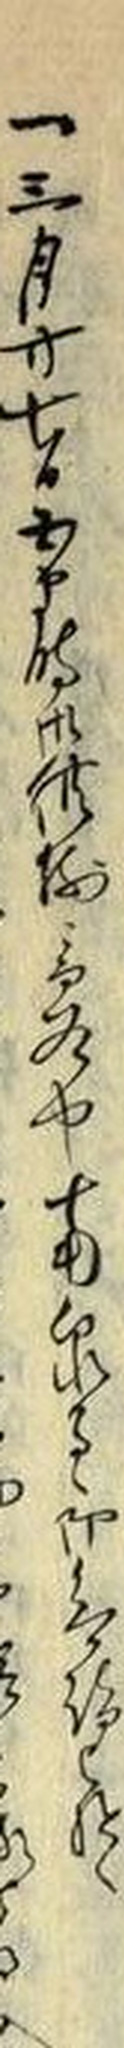一三月廿七日五半時御供揃ニ而谷中南泉寺へ御参詣被遊候
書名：少傅日録抄（斉承付側向頭取日記、在府）
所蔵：福井県文書館 Fukui Prefectural Archives
